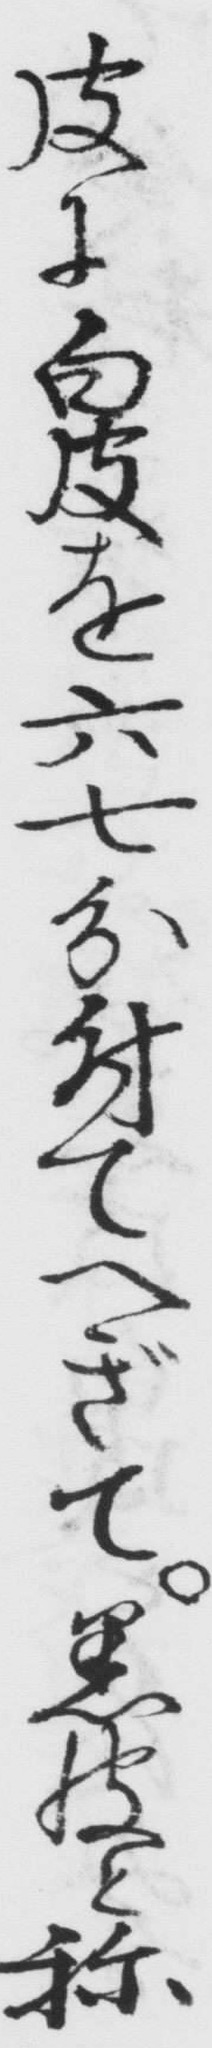皮に白皮を六七分付てへぎて。黒皮と称
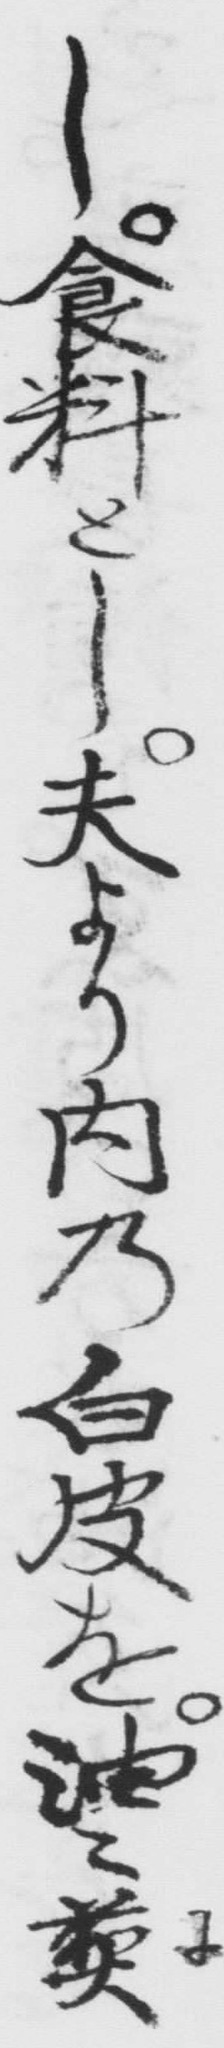し。食料とし。夫より内の白皮を。油に煎

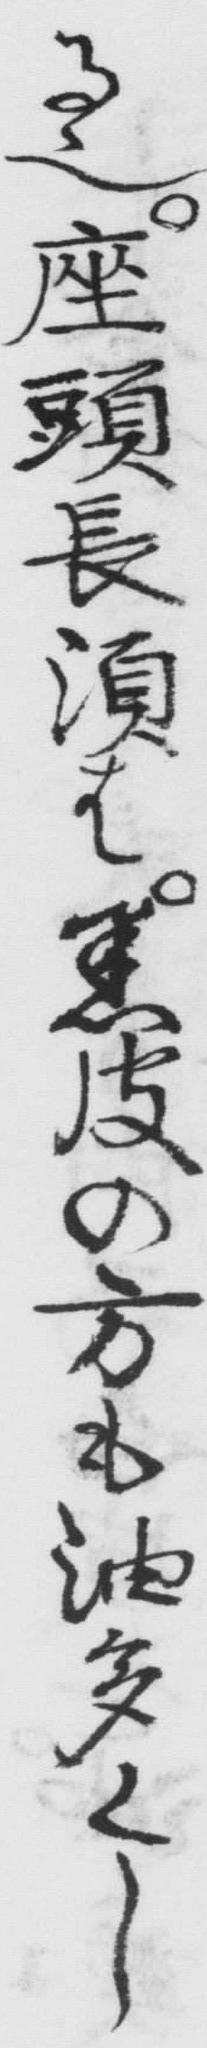る也。座頭長須は。黒皮の方も油多くし
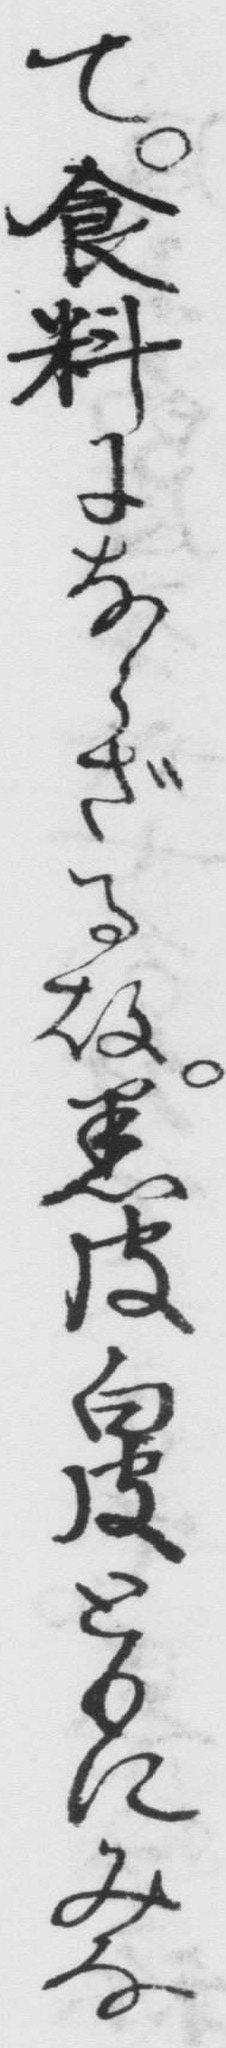て。食料にならざる故。黒皮白皮ともにみな
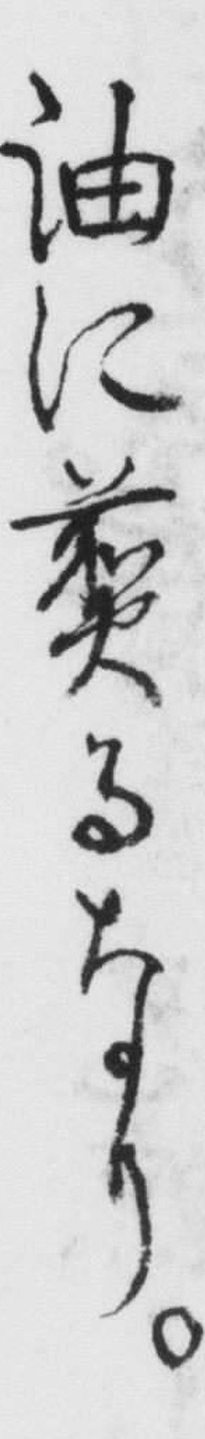油に煎るなり。
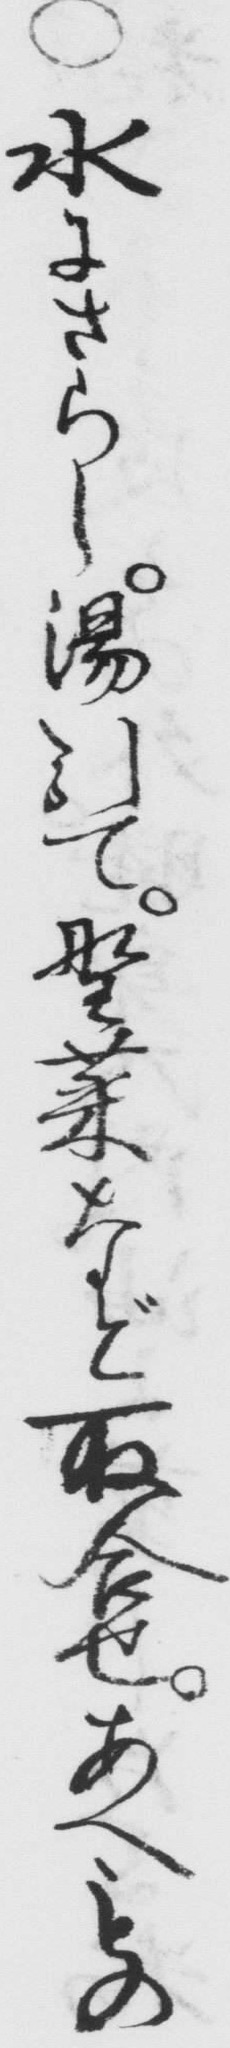○水にさらし。湯引て。野菜など取合せ。あへもの
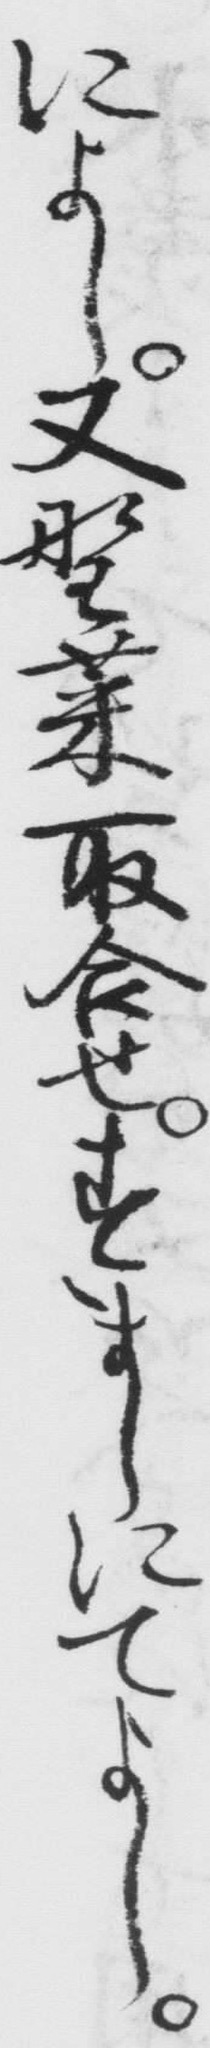によし。又野菜取合せ。すましにてよし。
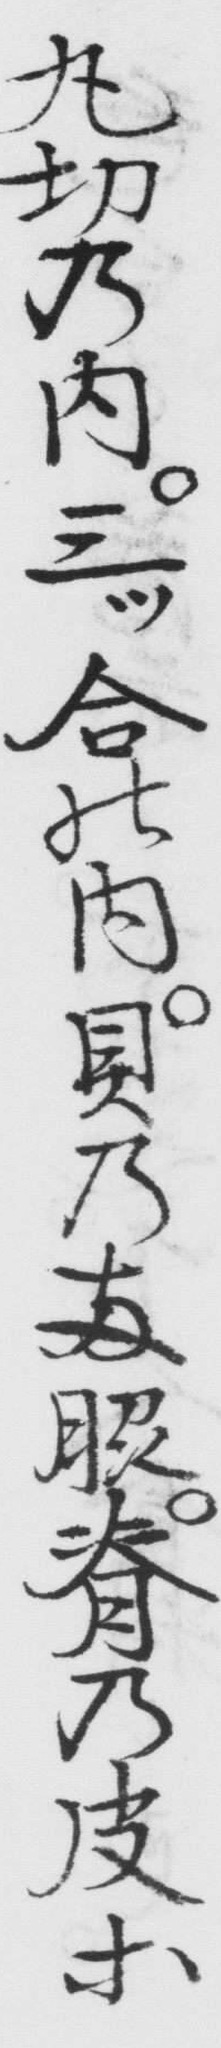筋丸切の内。三ツ合の内。貝の両脇。背の皮等
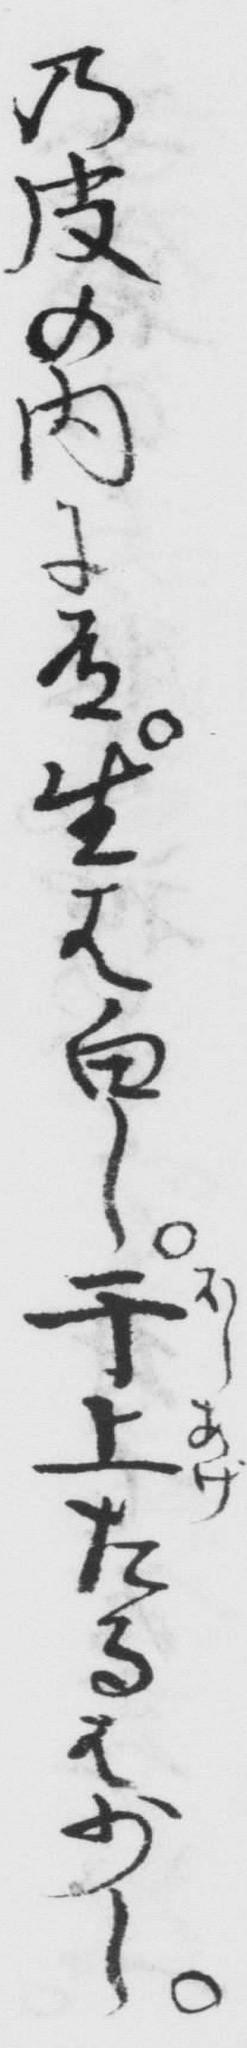の皮の内に有。生は白し。干上たるは少し。
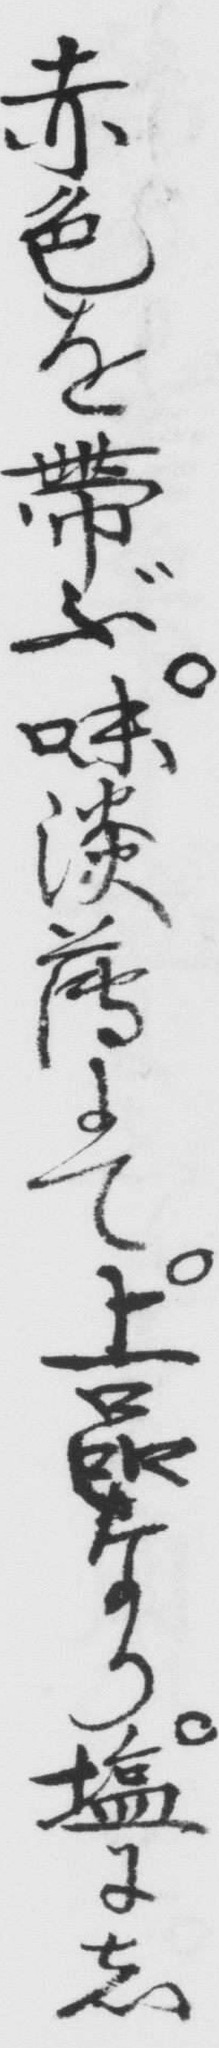赤色を帯ぶ。味淡薄にて。上品なり。塩にし
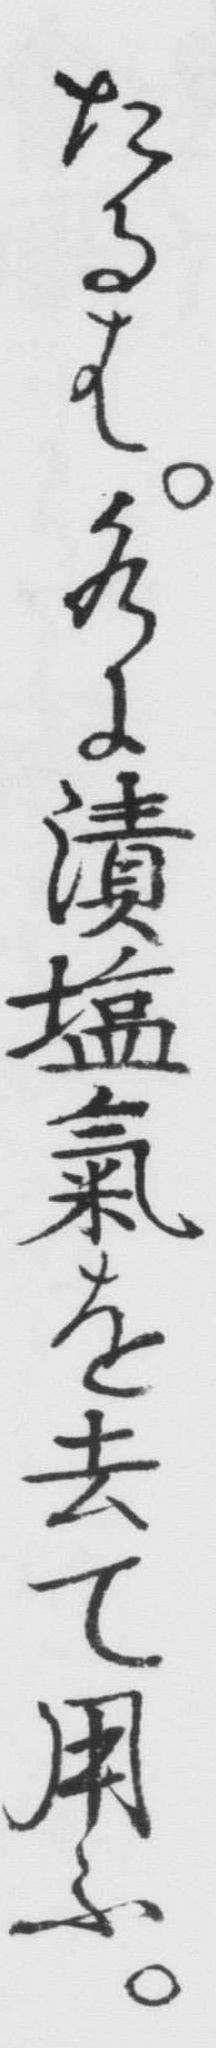たるは。水に漬塩気を去て用ふ。
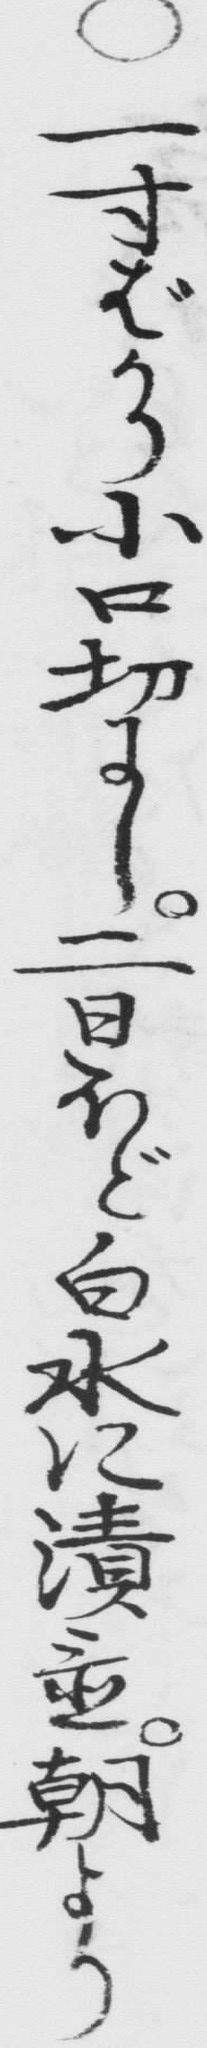○一寸ばかり小口切よし。二日ほど白水に漬置。朝から
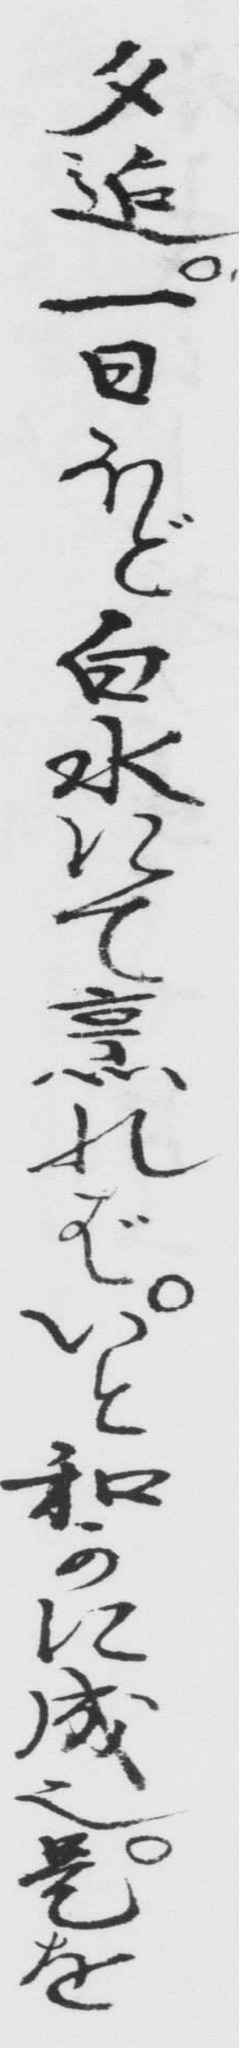夕迄。一日ほど白水にて烹れば。いと和かに成也。是を
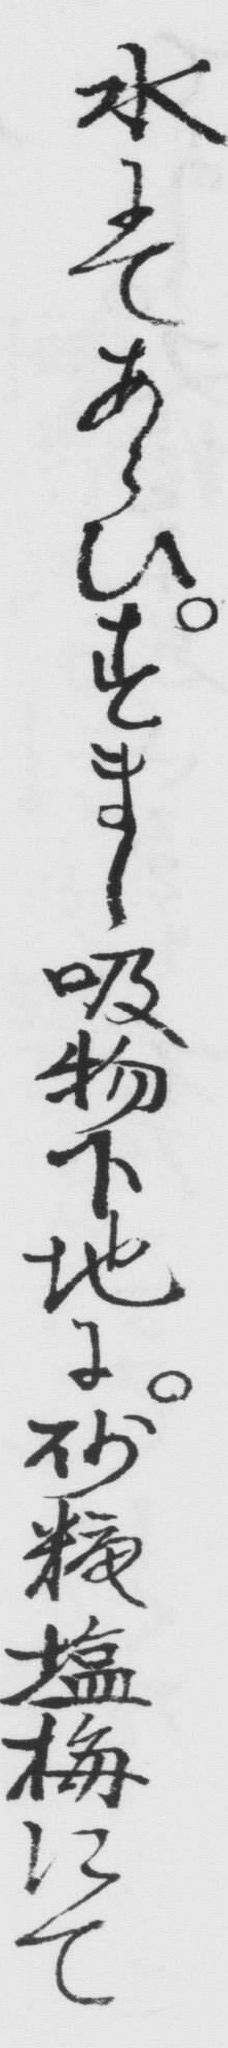水にてあらひ。すまし吸物下地に。砂糖塩梅にて
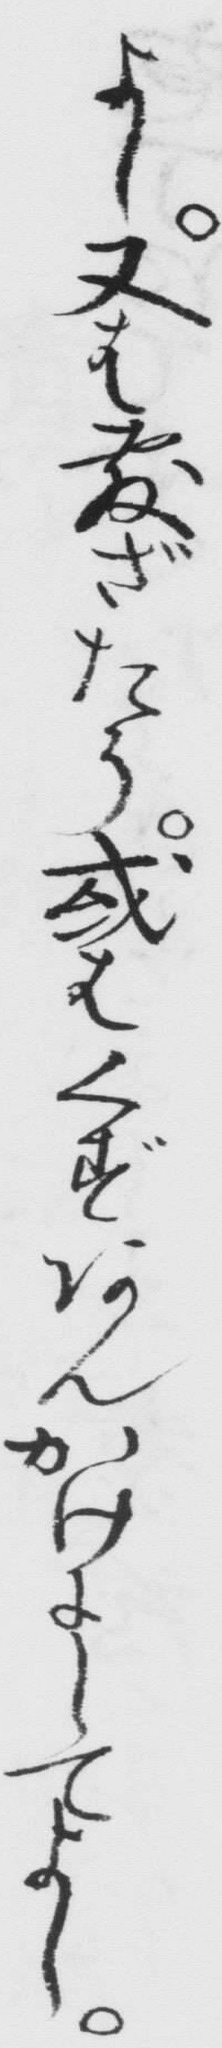よし。又は敷ざたう。或はくずあんかけにしてよし。
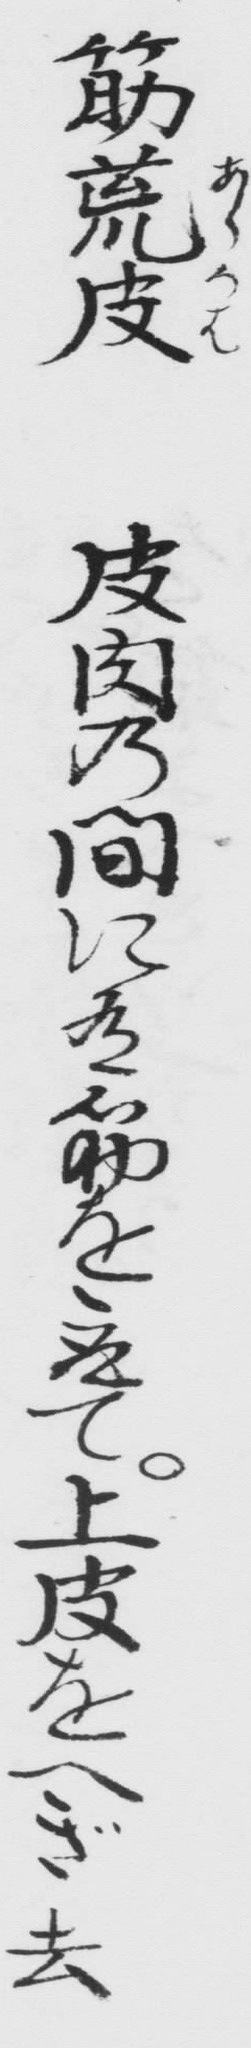筋荒皮皮肉の間に有筋を取て。上皮をへぎ去
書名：鯨肉調味方
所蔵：大阪府立大学学術情報センター 国文学研究資料館
